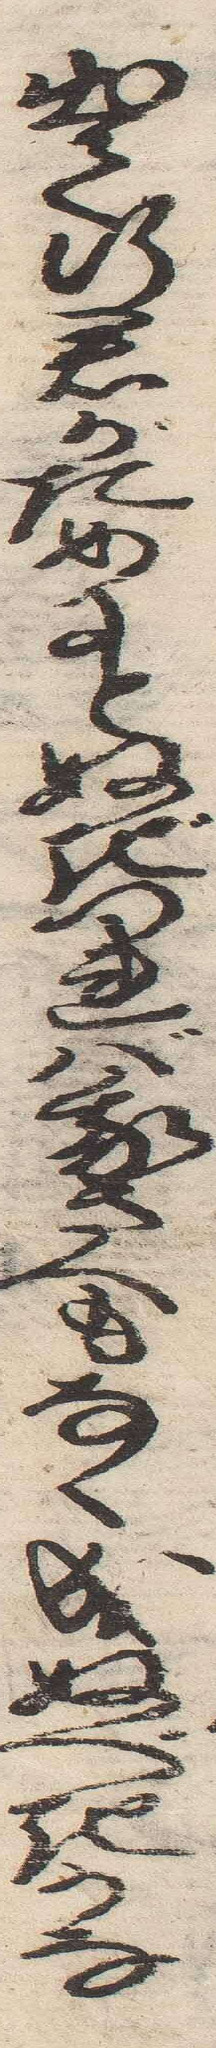出て行君がためにとぬぎつれば我さへもなく成ぬべきかな
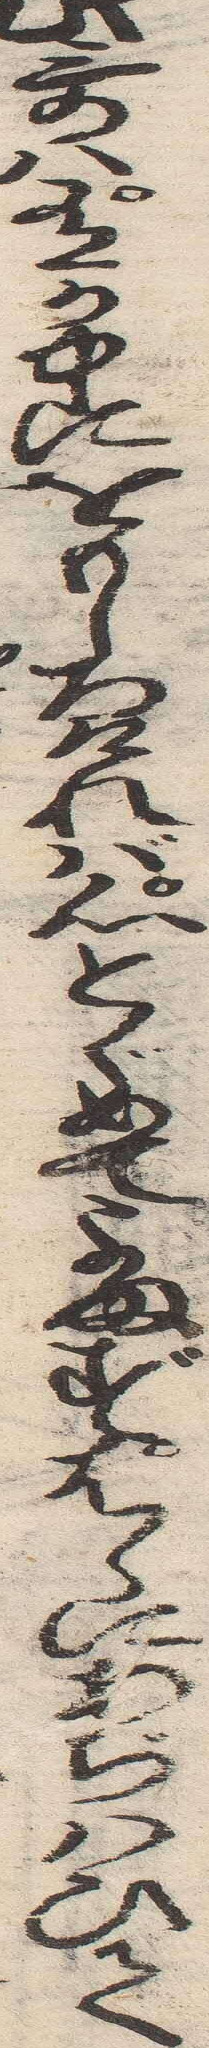此哥は。有か中にをもしろければ。心とゞめてよまず。はらにあぢはひて
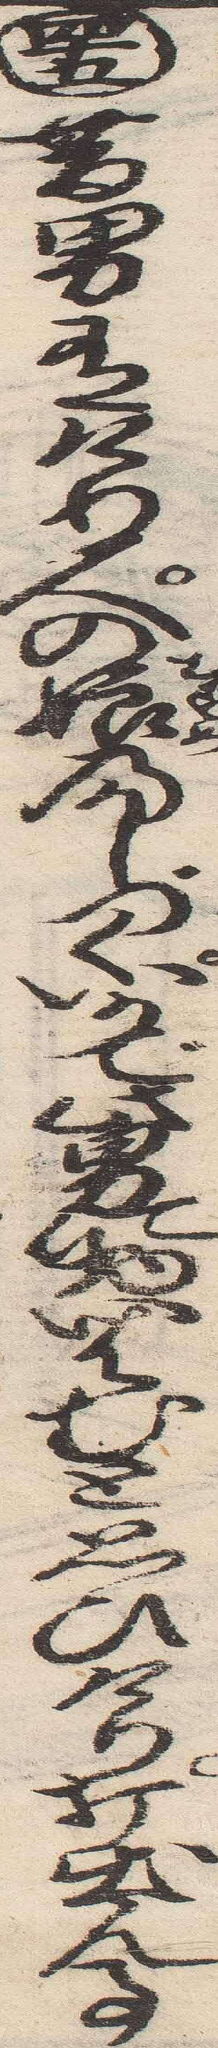四十五昔男有けり。人の娘のかしづく。いかで此男に物いはむと思ひけり。打出ん事
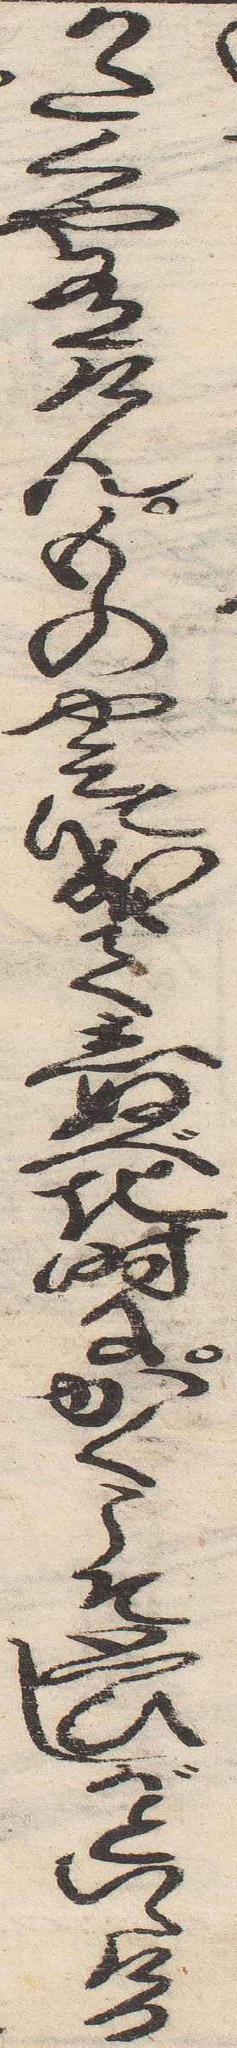かたくや有けん。ものやみに成てしぬべき時に。かくこそ思ひしがといゝける
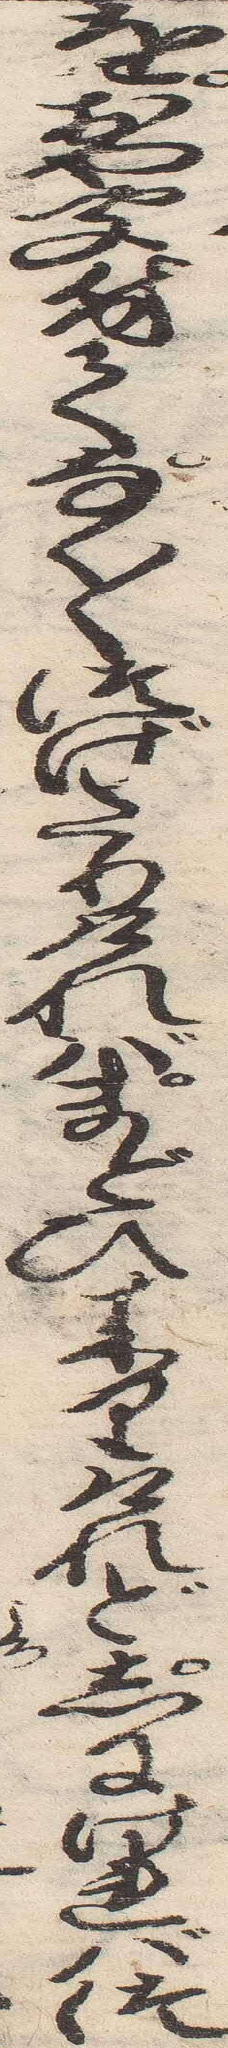を。おや聞付て。なく〳〵つげたりければ。まどひ来りけれど。しにければつ
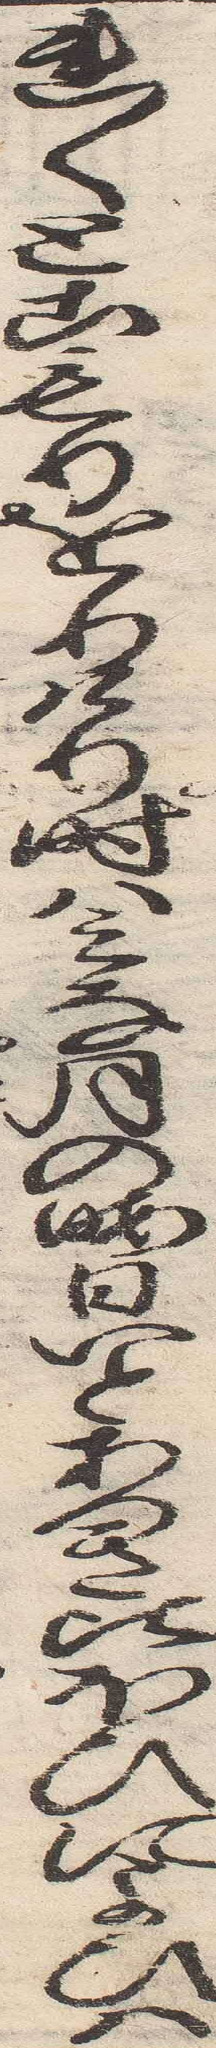れ〳〵とこもりをりけり。時はみな月の晦日いとあつき比ほひによひは
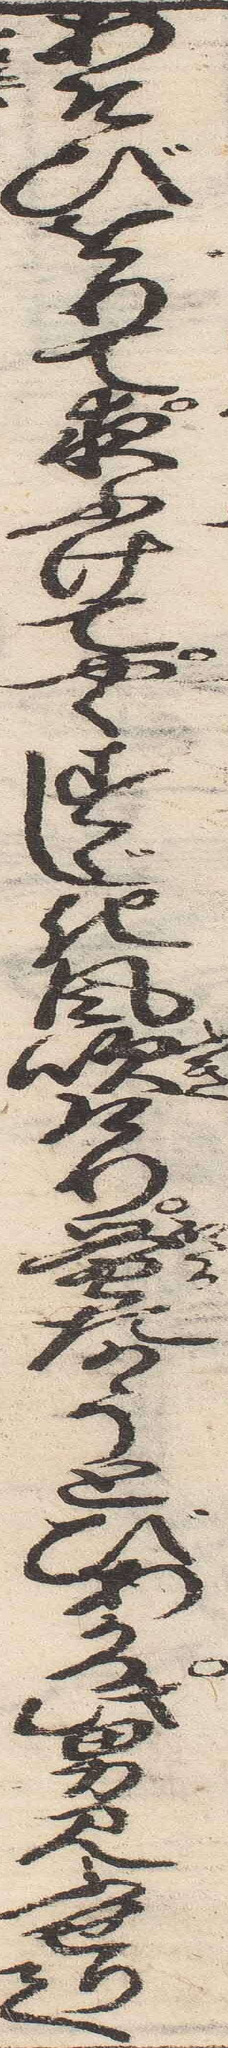あそびをりて。夜ふけて。やゝすゞしき風吹けり。蛍たかうとびあかる。此男見ふせりて
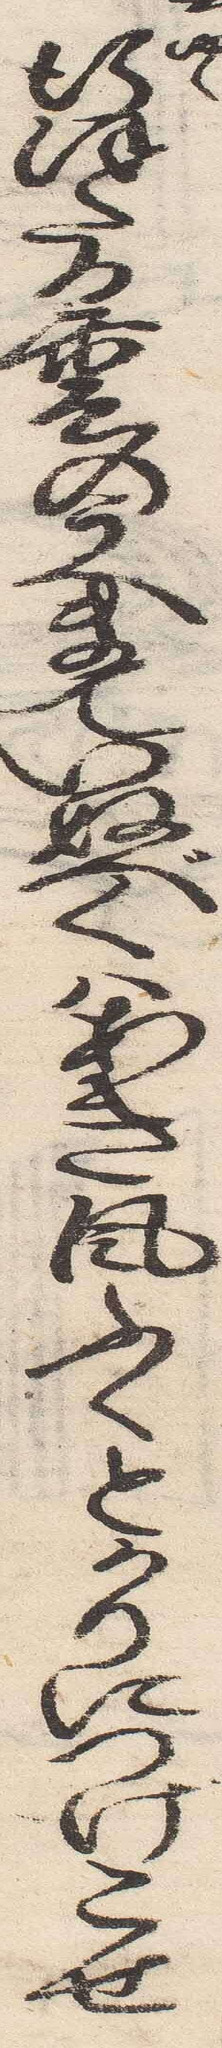後撰行ほたる雲のうへまていぬべくはあき風ふくとかりにつげこせ
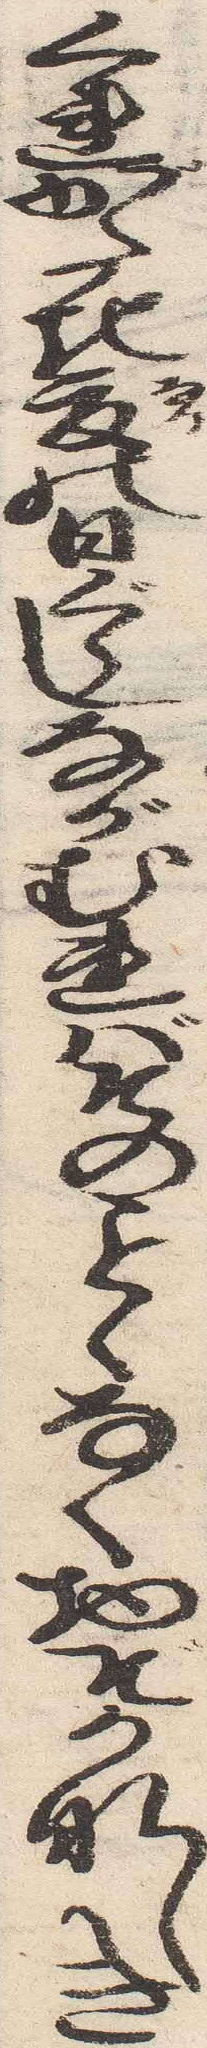くれがたき夏の日ぐらしながむればそのことゝなく物ぞかなしき
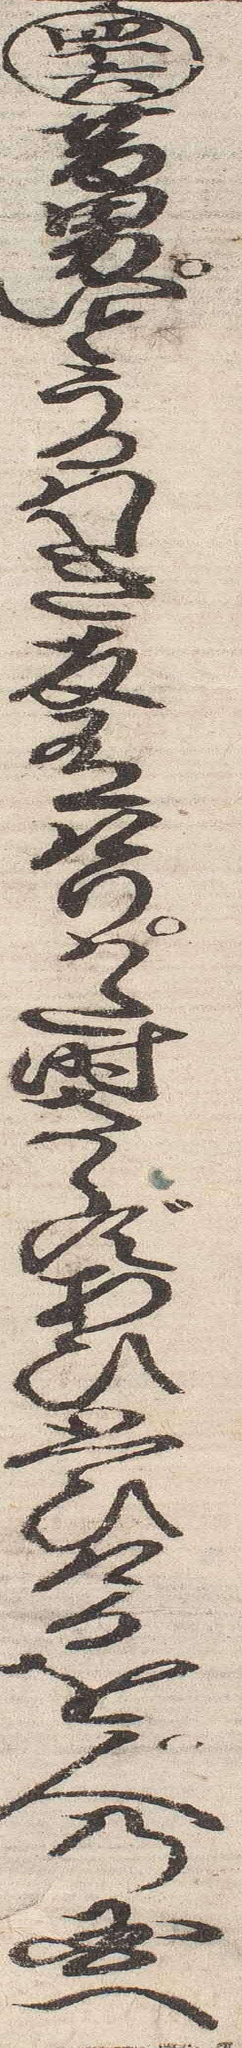四十六昔男。いとうるはしき友有けり。かた時さらずあひ思ひけるを。人の国へ
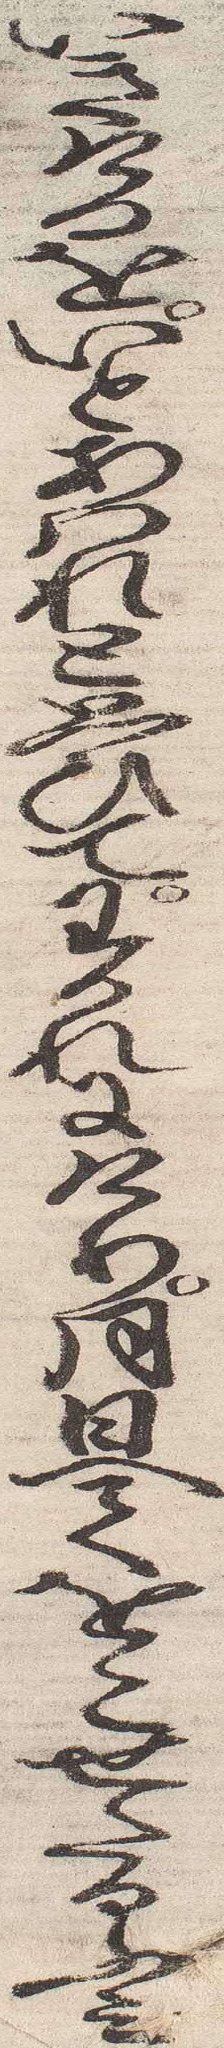いきけるを。いとあはれと思ひて。わかれにけり。月日へてをこせたるふみ
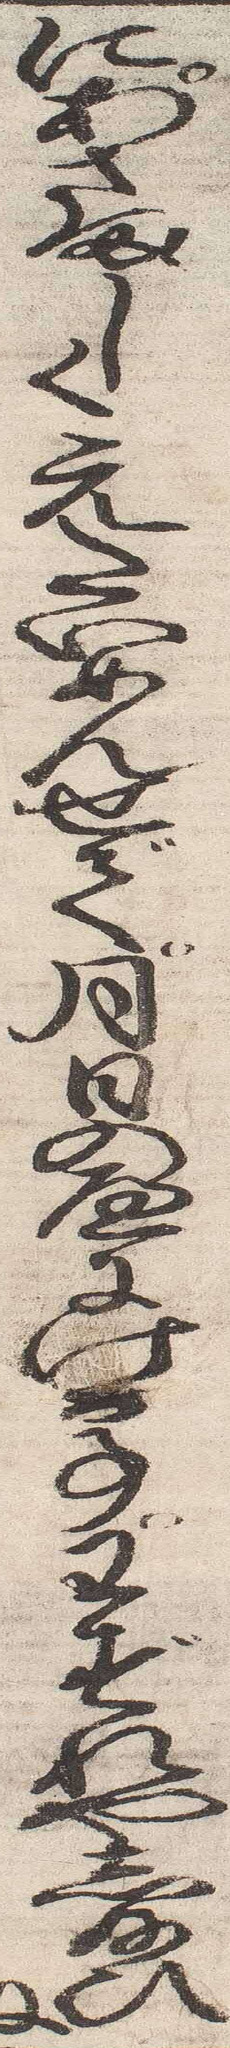に。あさましくえたいめんせで。月日のへにける事。わずれやし給ひに
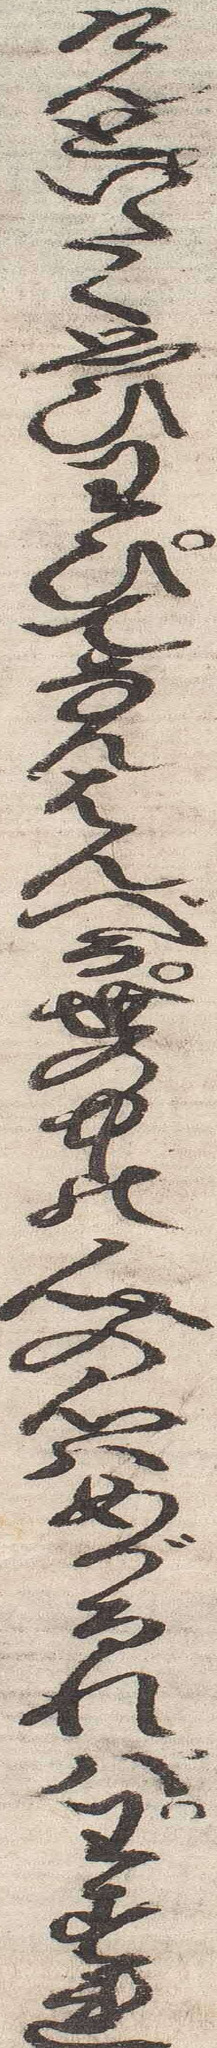けんと。いたく思ひわぴてなんはんべる。世の中の人の心はめがるれば。わすれ
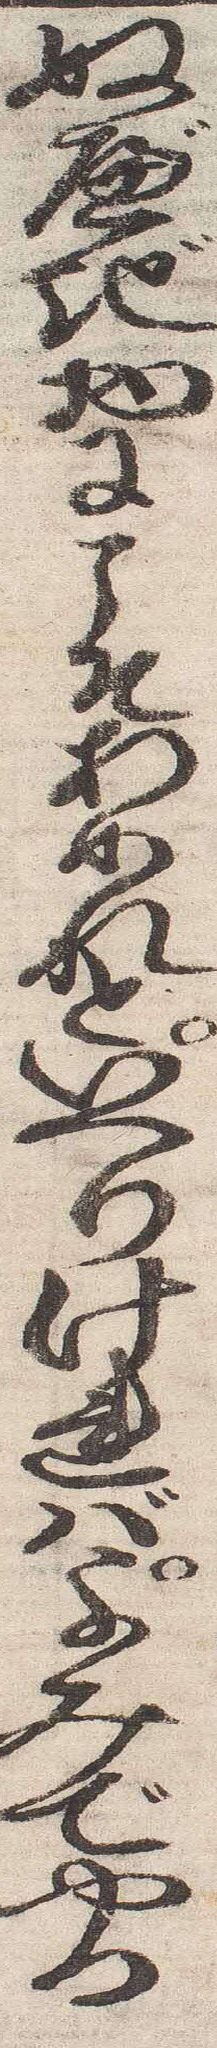ぬべぎ物にこそあめれと。いへりければ。よみでやる
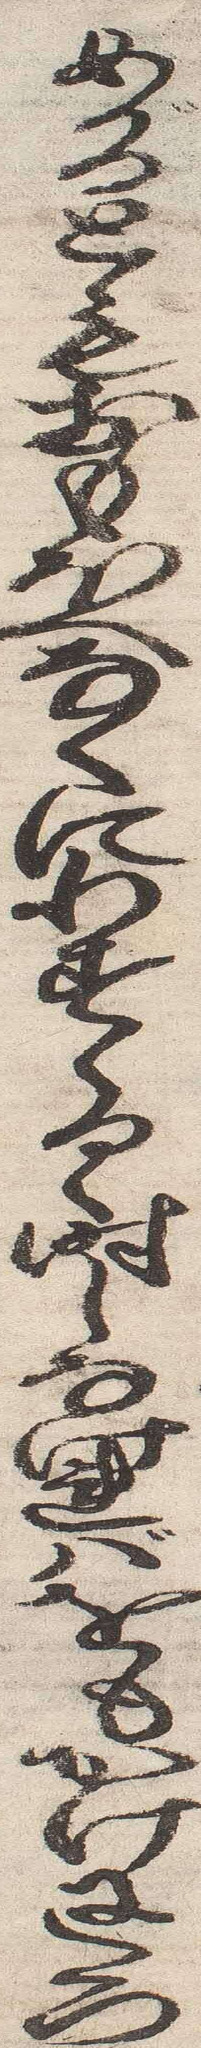めがるともおもほへなくにわすらるゝ時しなければをもかげにたつ
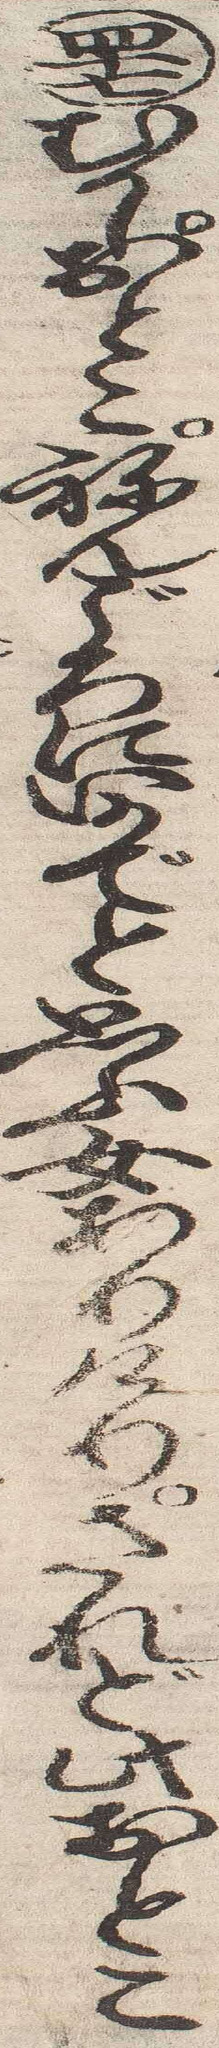四十七むかし。おとこ。ねんごろにいかでと思ふ女ありけり。されど此おとこ
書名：伊勢物語
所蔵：東京学芸大学附属図書館 国文学研究資料館
